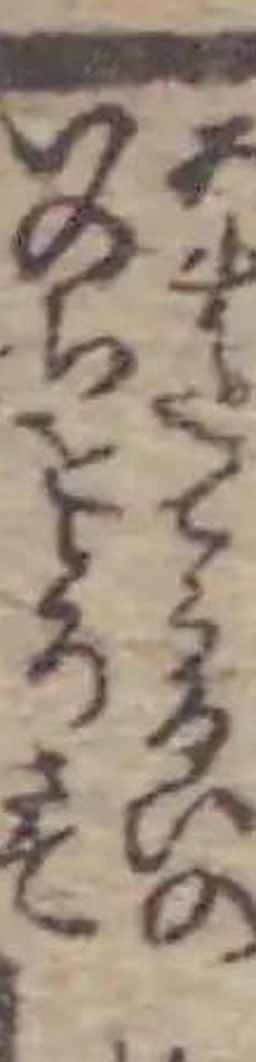いのちをとりさて
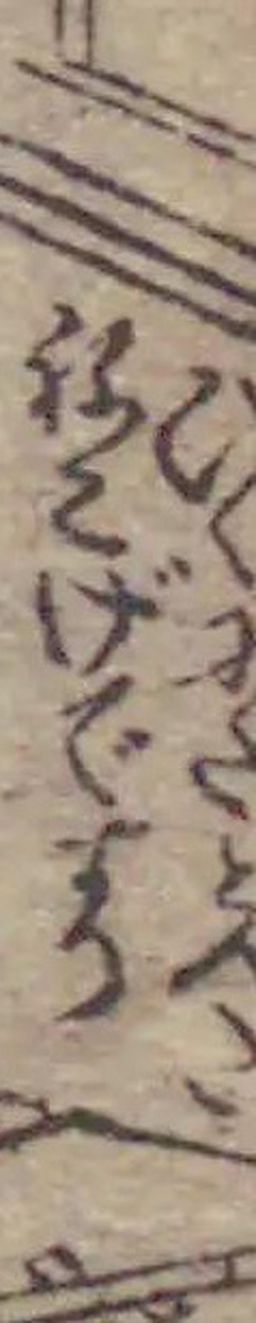ねこげですり
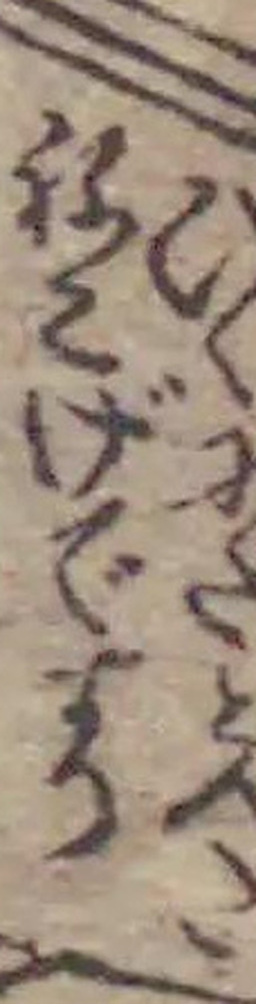ねこげですり
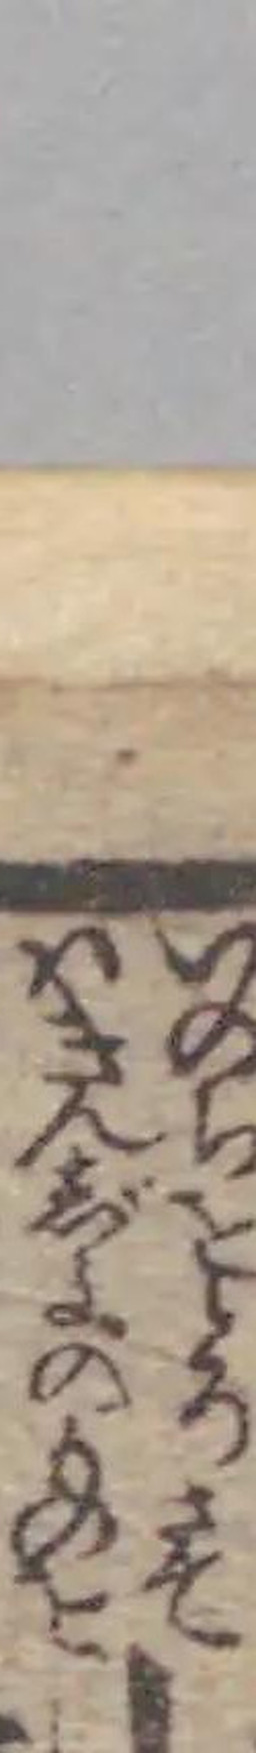はきんじよのものを
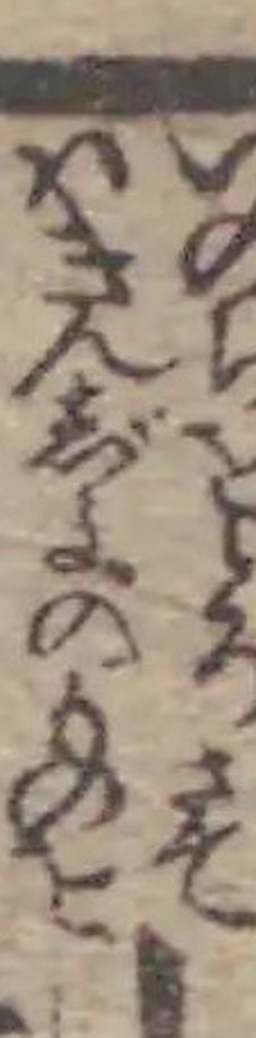はきんじよのものを
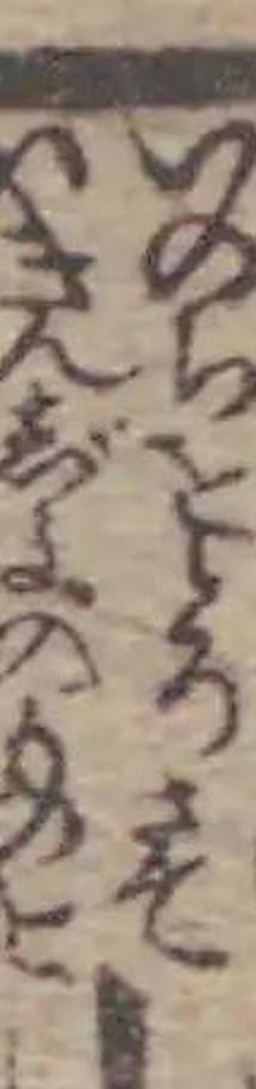はきんじよのものを
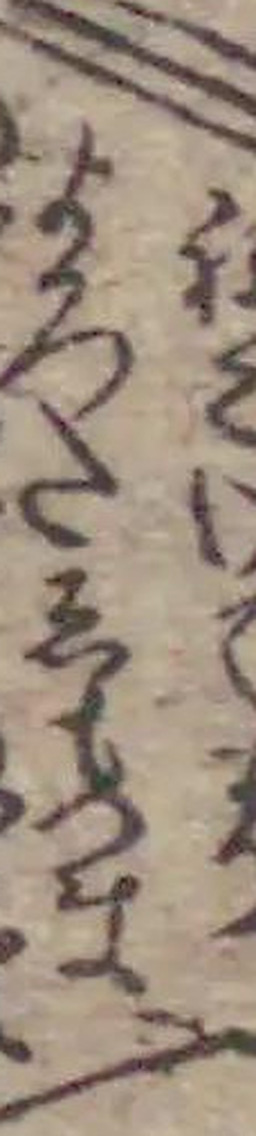よかつたしもつま
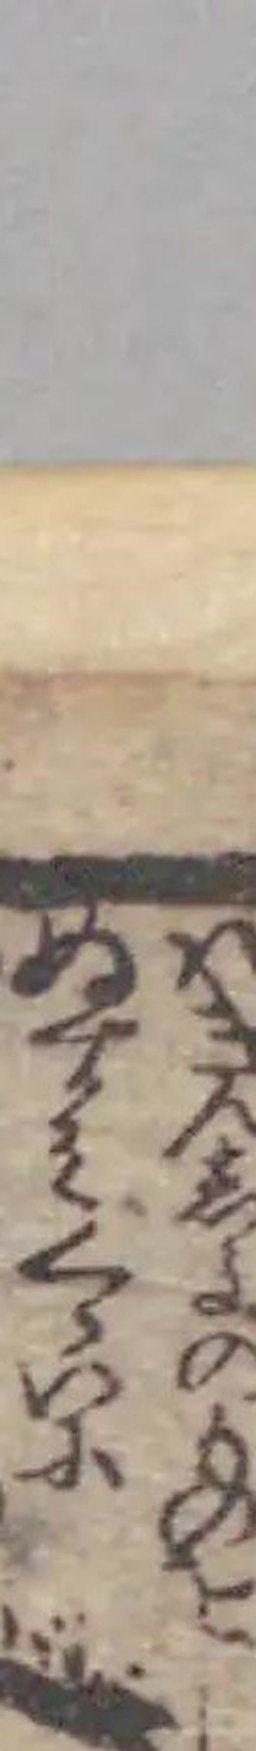ぬすみくらいに
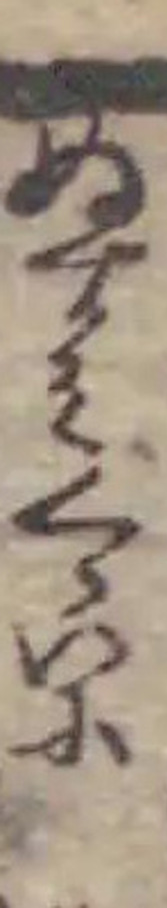ぬすみくらいに
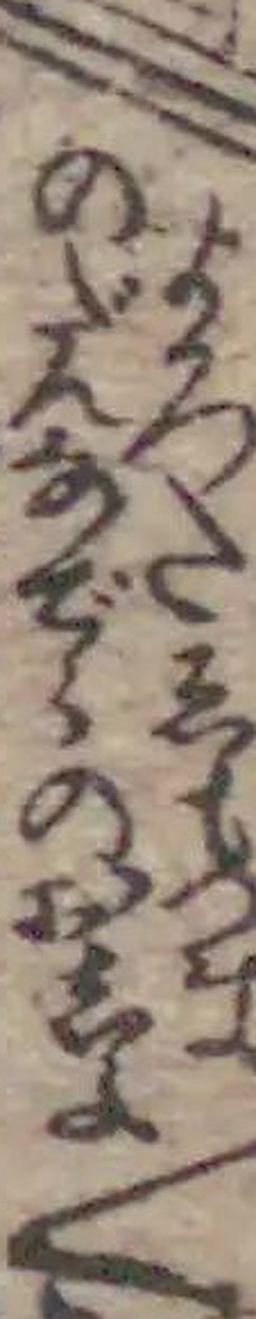のだんなでらのおしよ
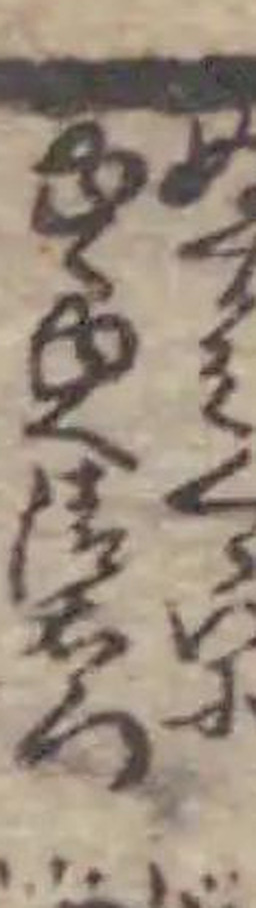ゆくゆへ清右エ門
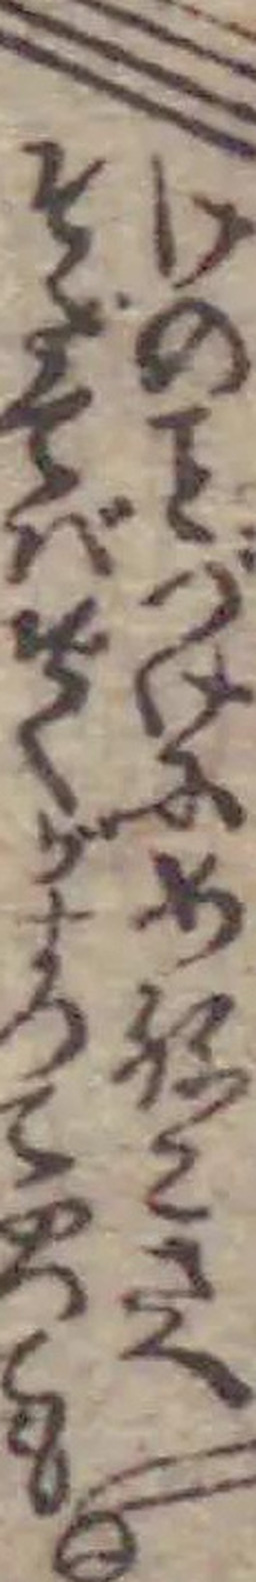そだてばがすつてやつても
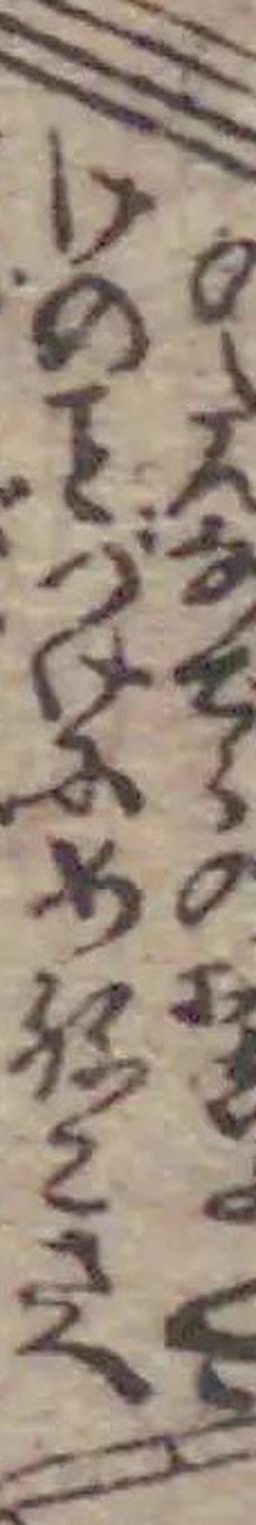けのことづけにめねこさへ
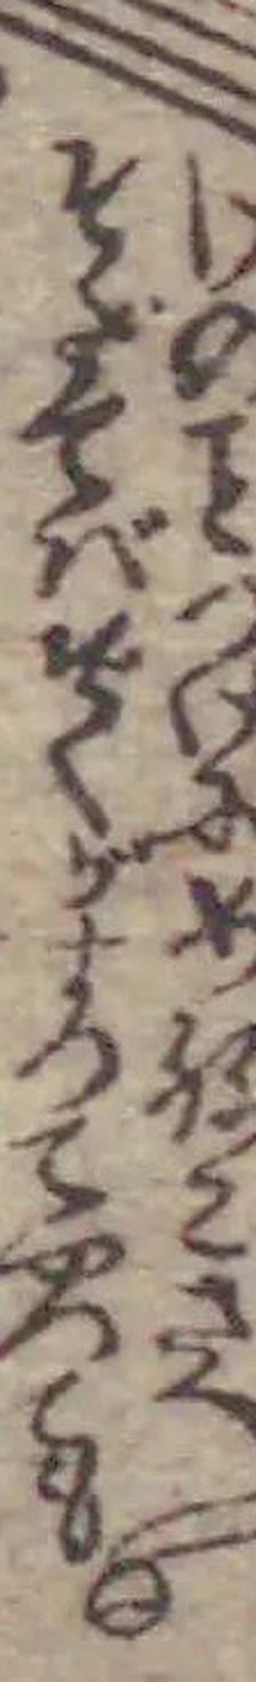そだてばがすつてやつても
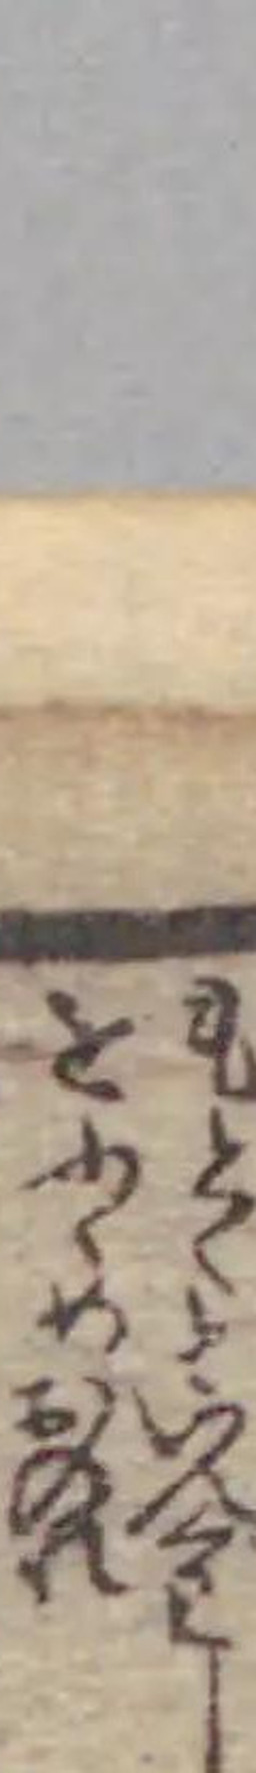をふくめおのれ
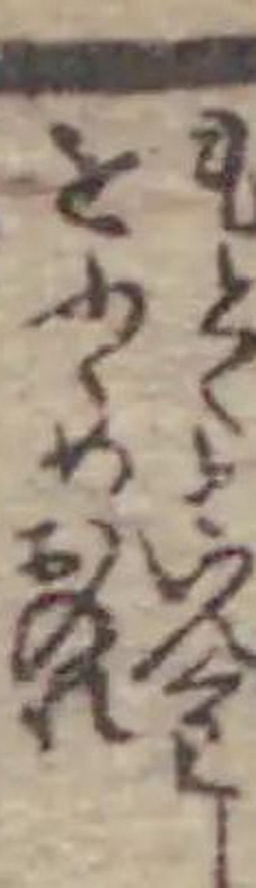をふくめおのれ
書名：冷水灰毛猫 2巻
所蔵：国立国会図書館 National Diet Library, JAPAN
